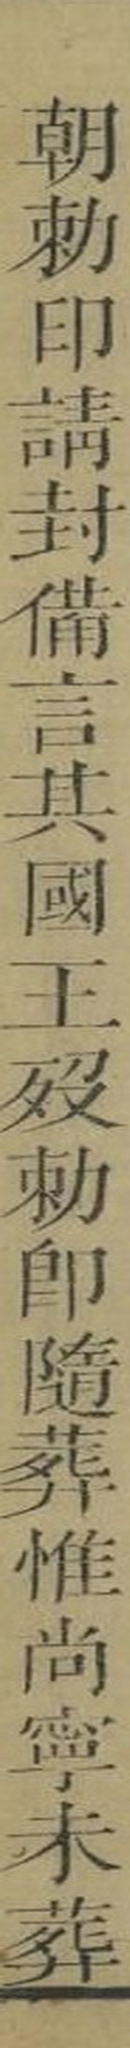朝勅印請封備言其国王歿勅即随葬惟尚寧未葬

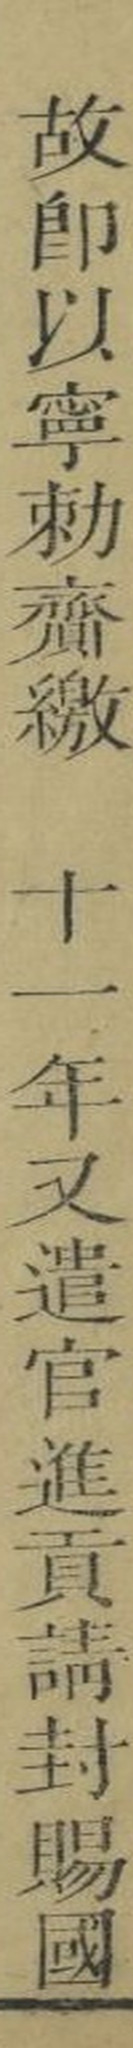故即以寧勅齎繳十一年又遣官進貢請封賜国
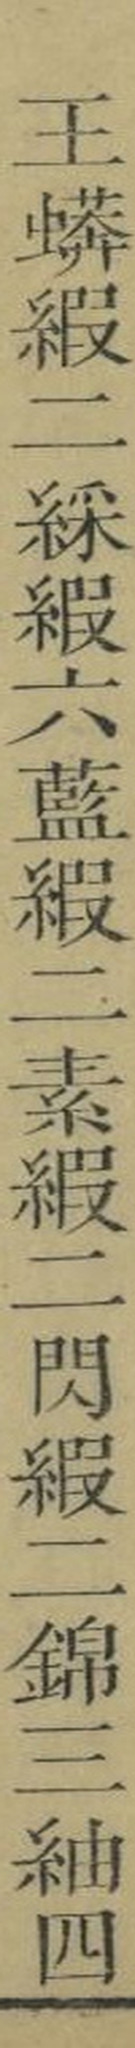王蟒緞二綵緞六藍緞二素緞二閃緞二錦三紬四
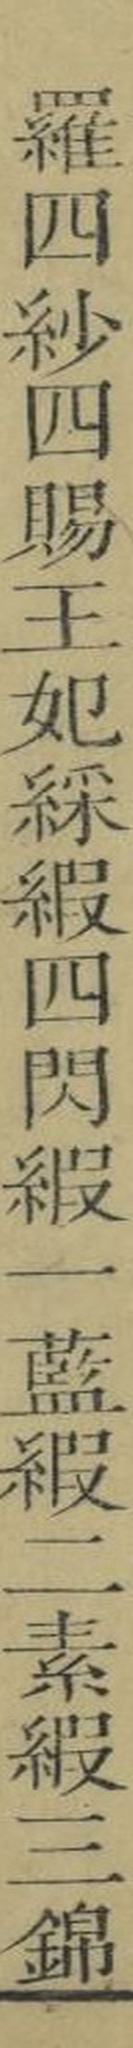羅四紗四賜王妃綵緞四閃緞一藍緞二素緞三錦
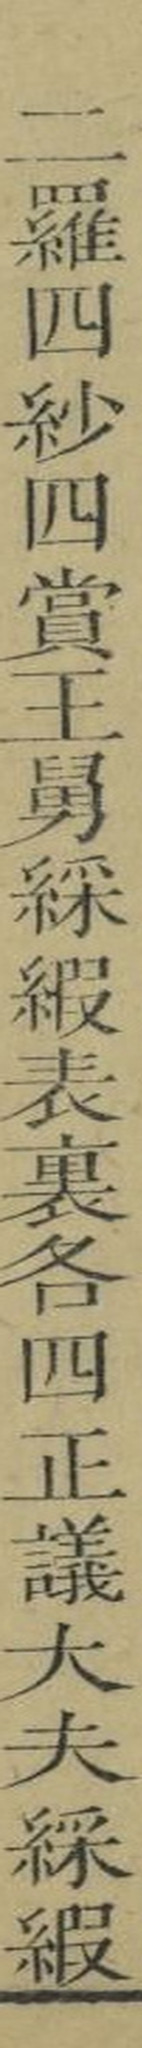二羅四紗四賞王舅綵緞表裏各四正議大夫綵緞
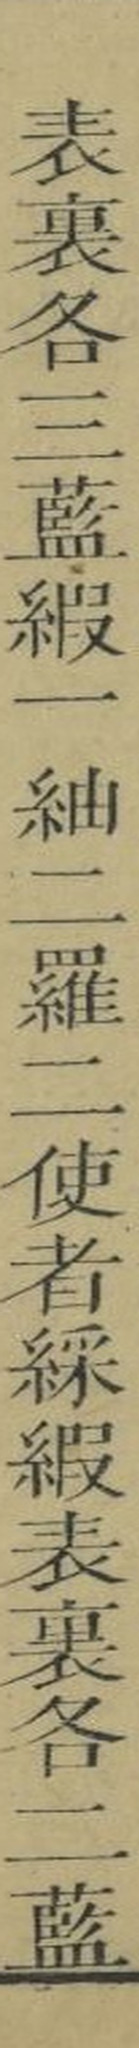表裏各三藍緞一紬二羅二使者綵緞表裏各二藍
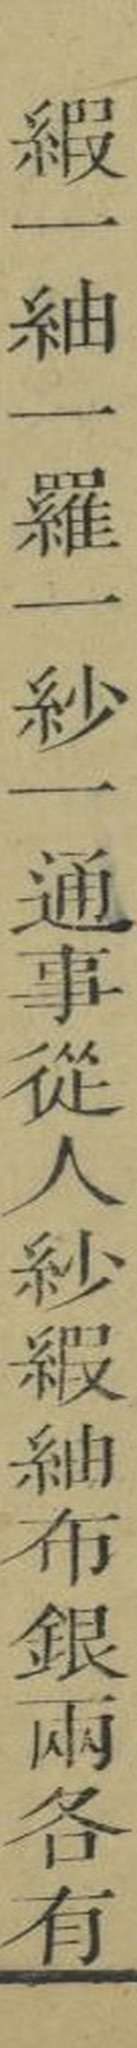緞一紬一羅一紗一通事従人紗緞紬布銀両各有
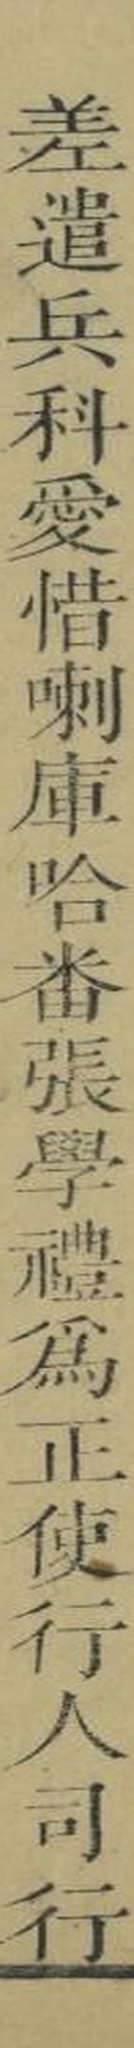差遣兵科愛惜喇庫哈番張学礼為正使行人司行
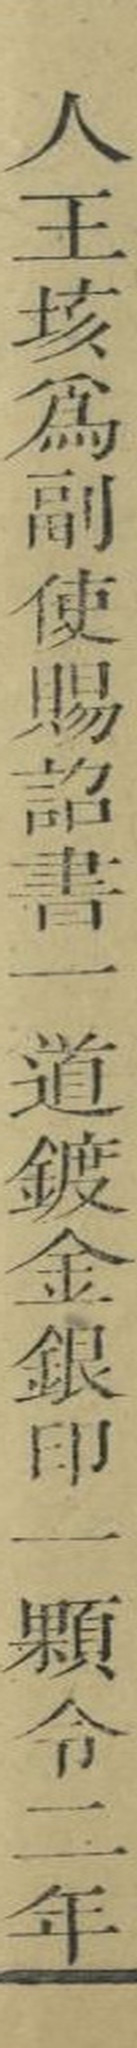人王垓為副使賜詔書一道鍍金銀印一顆令二年
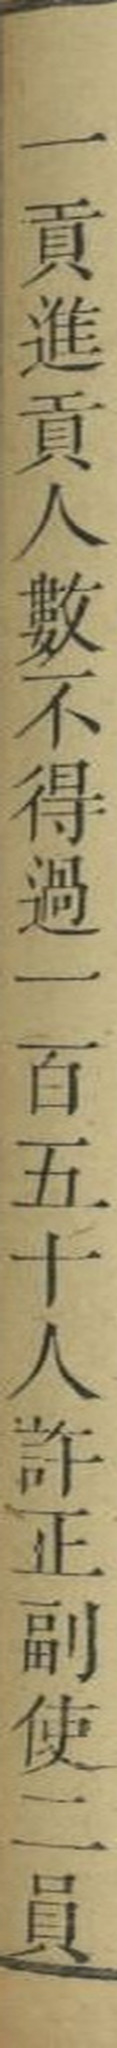一貢進貢人数不得過一百五十人許正副使二員
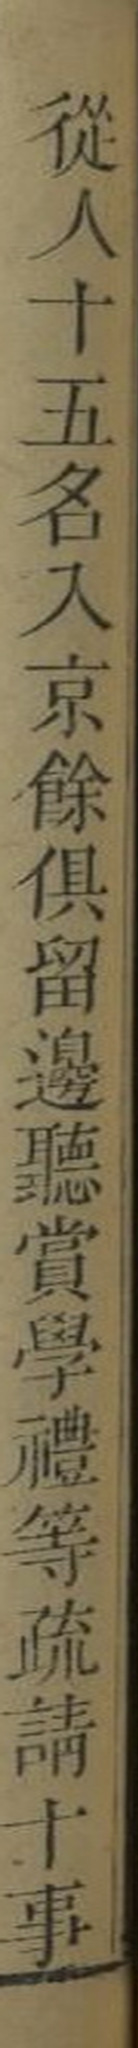従人十五名入京余俱留辺聴賞学礼等疏請十事
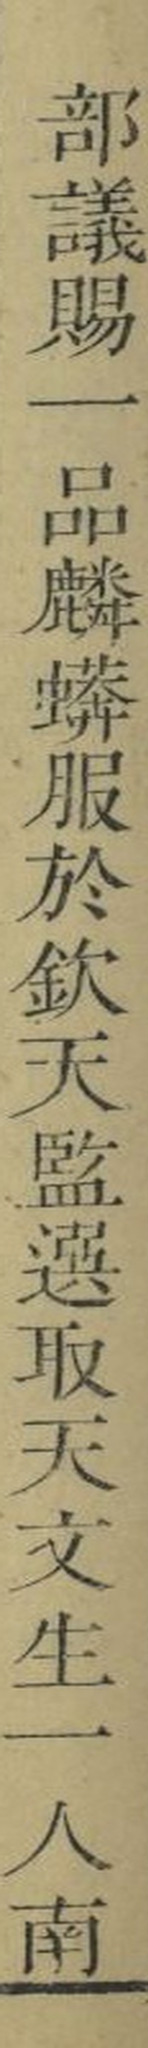部議賜一品麟蟒服於欽天監選取天文生一人南
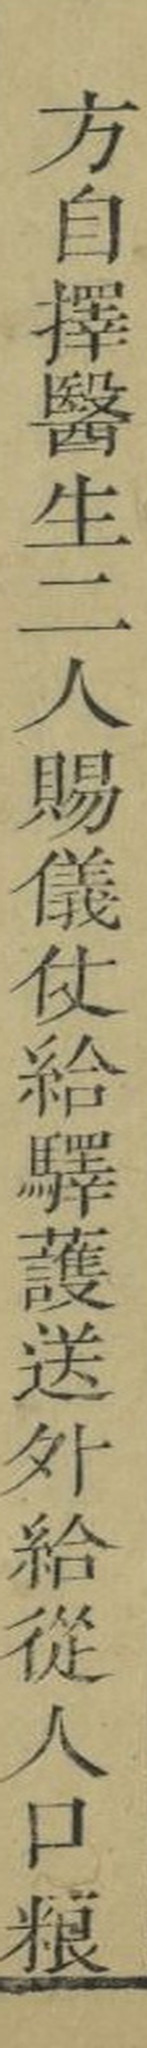方自択医生二人賜儀仗給駅護送外給従人口糧
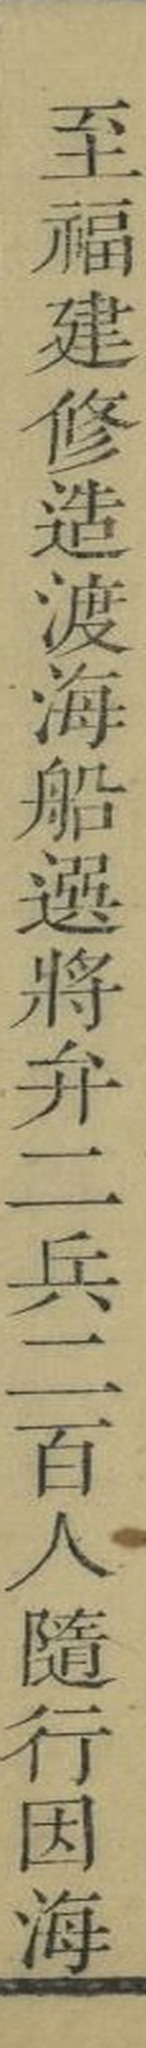至福建修造渡海船選将弁二兵二百人随行因海
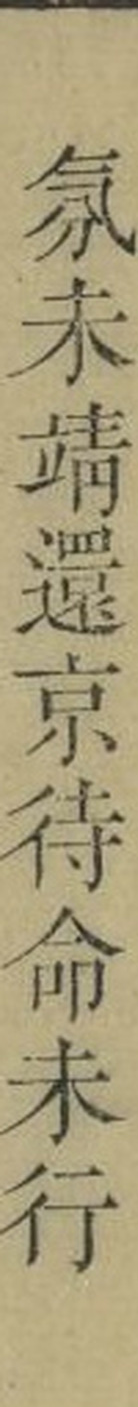氛未靖還京待命未行
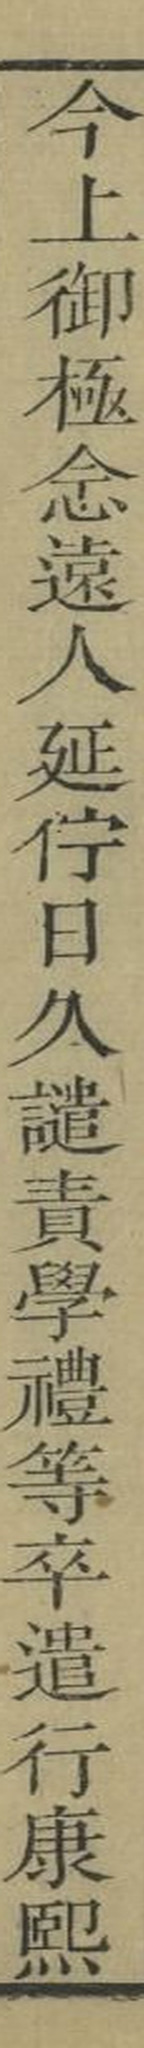今上御極念遠人延佇日久譴責学礼等卒遣行康煕
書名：中山伝信録 巻三
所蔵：University of the Ryukyus Library
